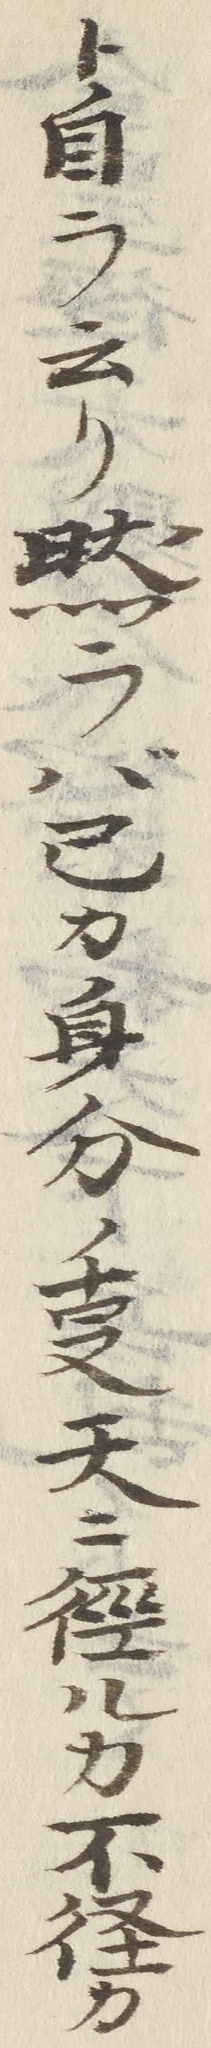ト自ラ云リ然ラバ己カ身分ノ事天ニ径ルカ不径カ
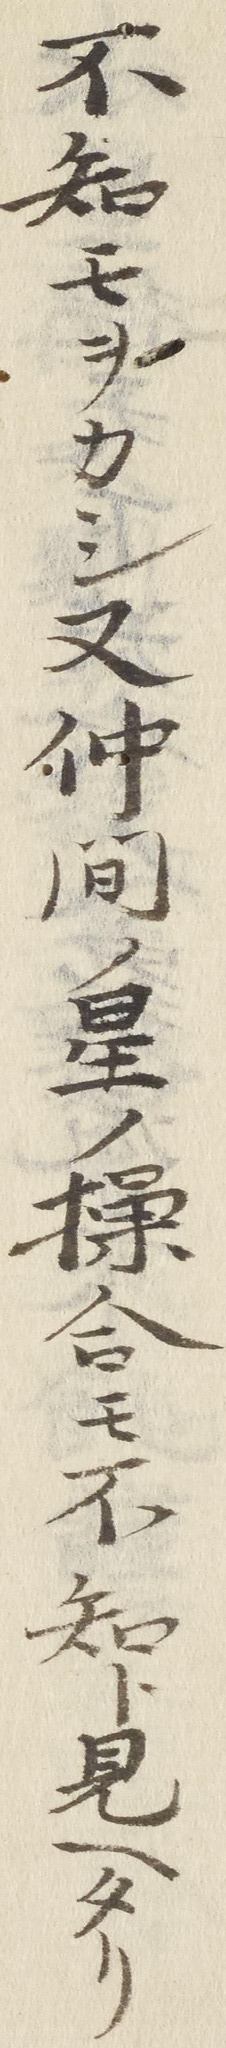不知モヲカシ又仲間ノ星ノ操合モ不知ト見ヘタリ
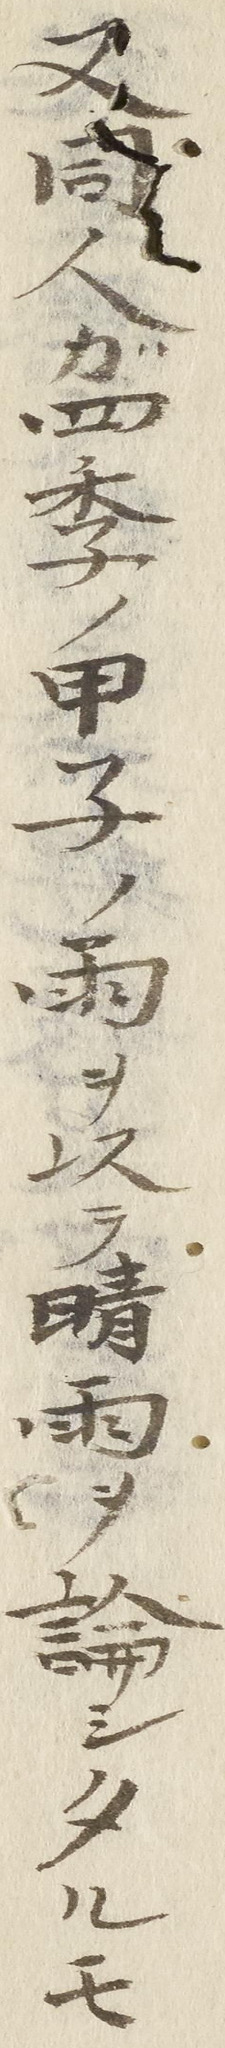又同人ガ四季ノ甲子ノ雨ヲ以テ晴雨ヲ論シタルモ
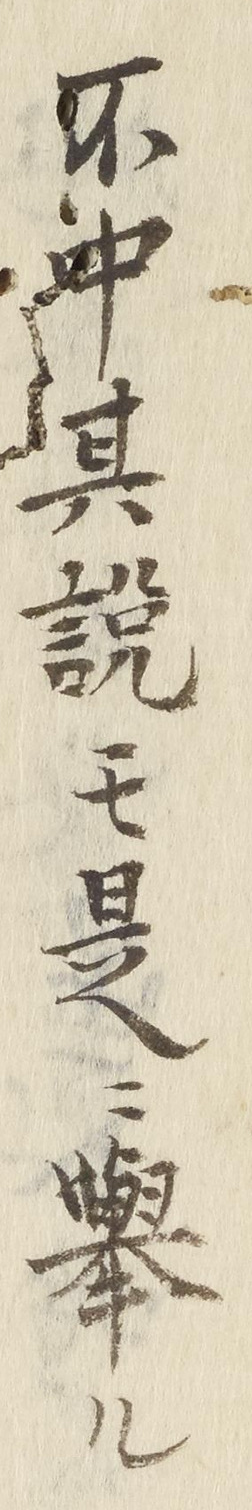不中其説モ是ニ挙ル
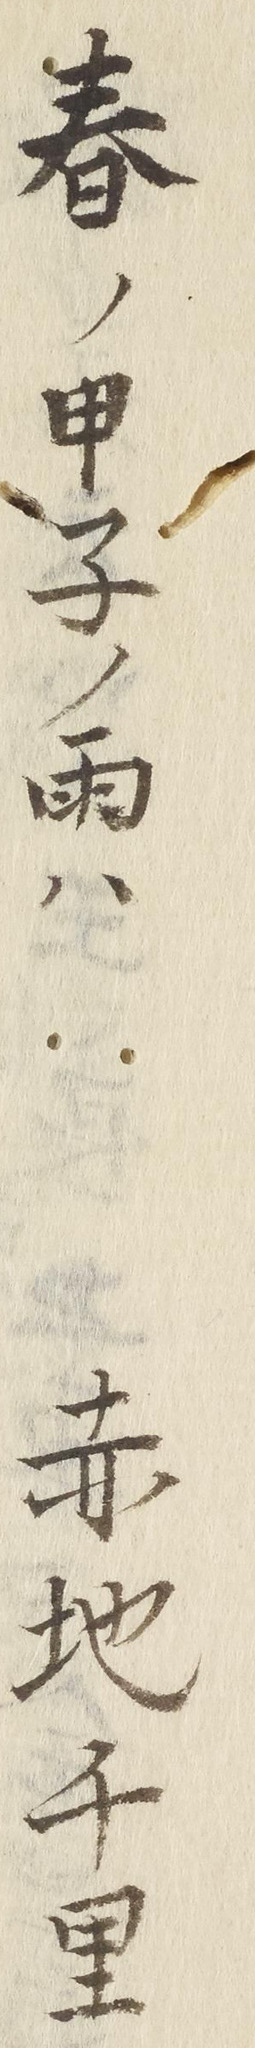春ノ甲子ノ雨ハ赤地千里
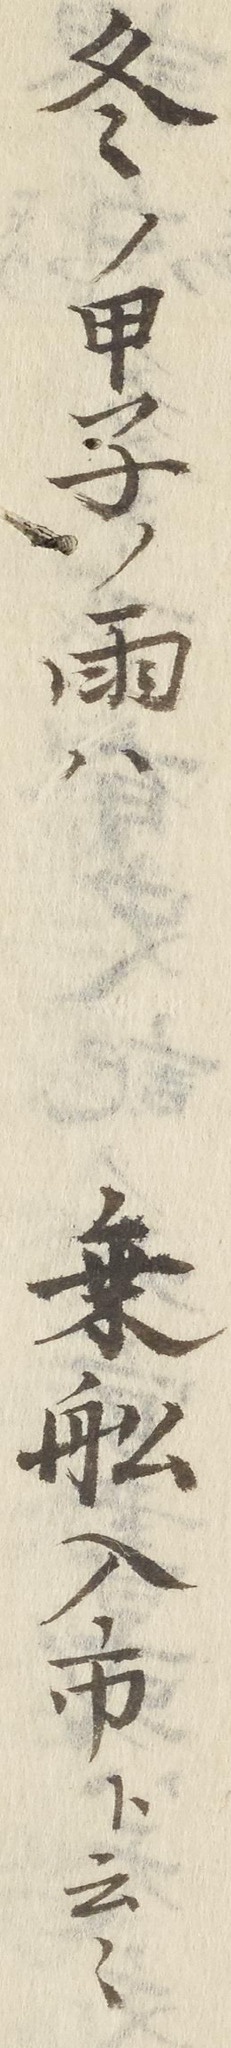冬ノ甲子ノ雨ハ乗船入市ト云々
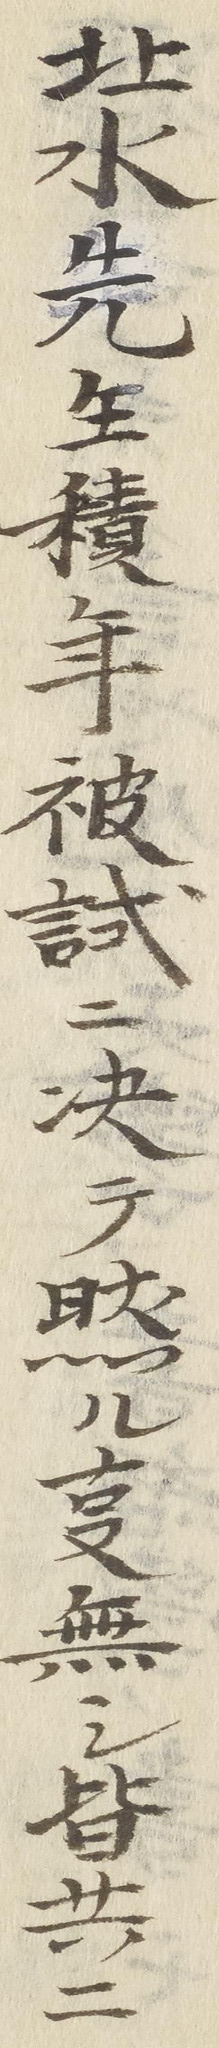北水先生積年被試ニ決テ然ル事無シ皆共ニ

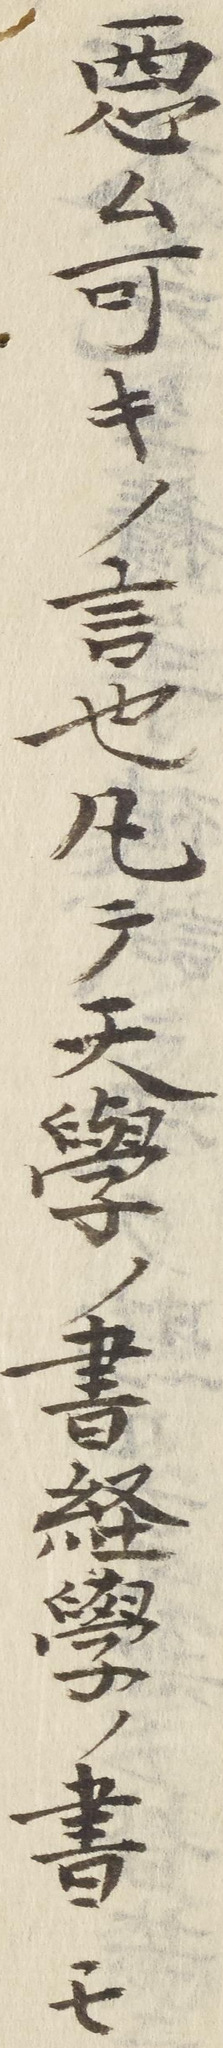悪ム可キノ言也凡テ天学ノ書経学ノ書モ
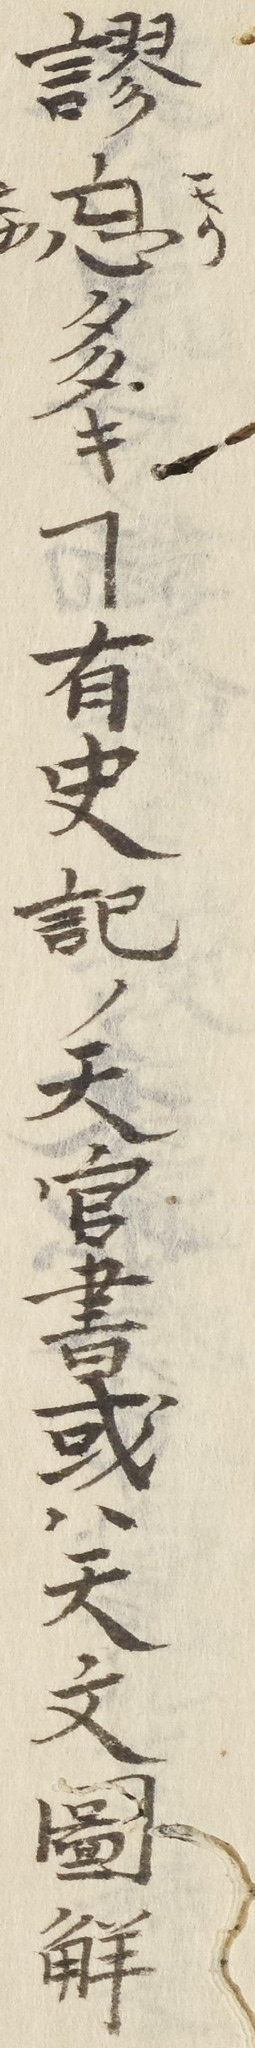謬-忘多キコト有史記ノ天宮書或ハ天文図解
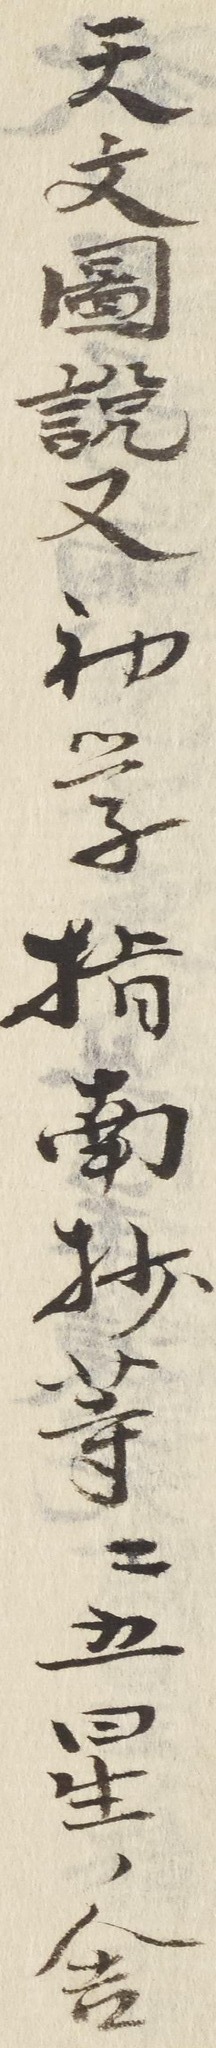天文図説又初学指南抄等ニ五星ノ舎
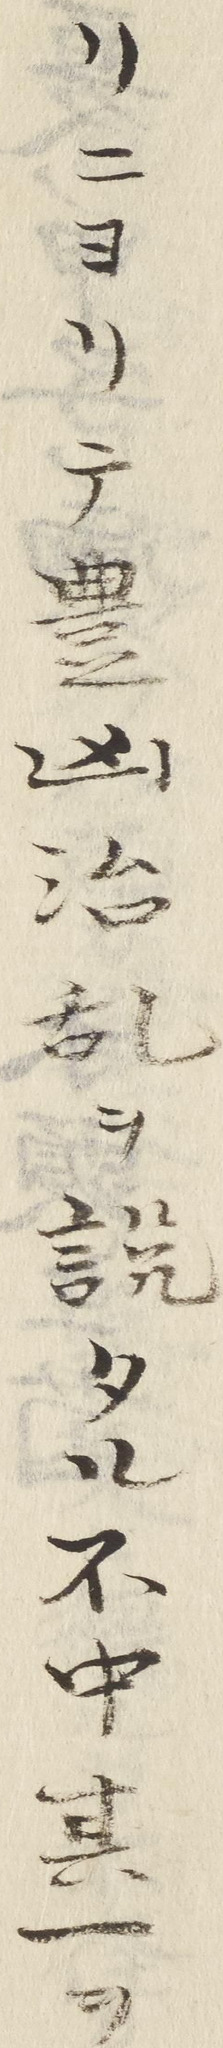リニヨリテ豊凶治乱ヲ説タル不中其一ヲ
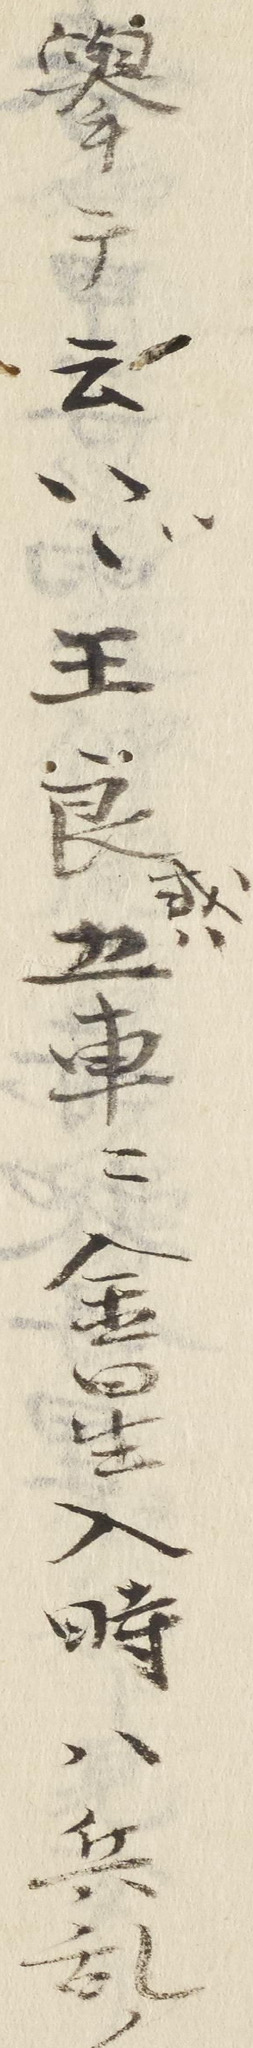挙テ云ハヾ王良五車ニ金星入時ハ兵乱ノ
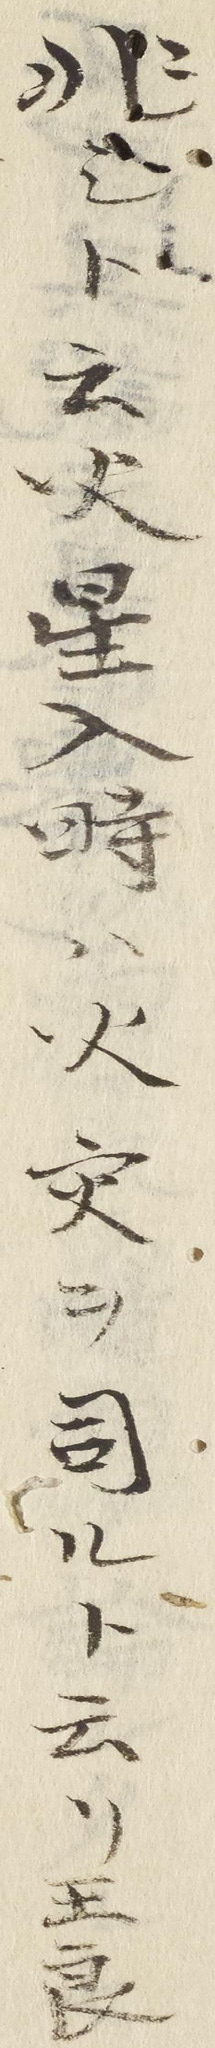兆シト云火星入時ハ火災ヲ司ルト云り王良
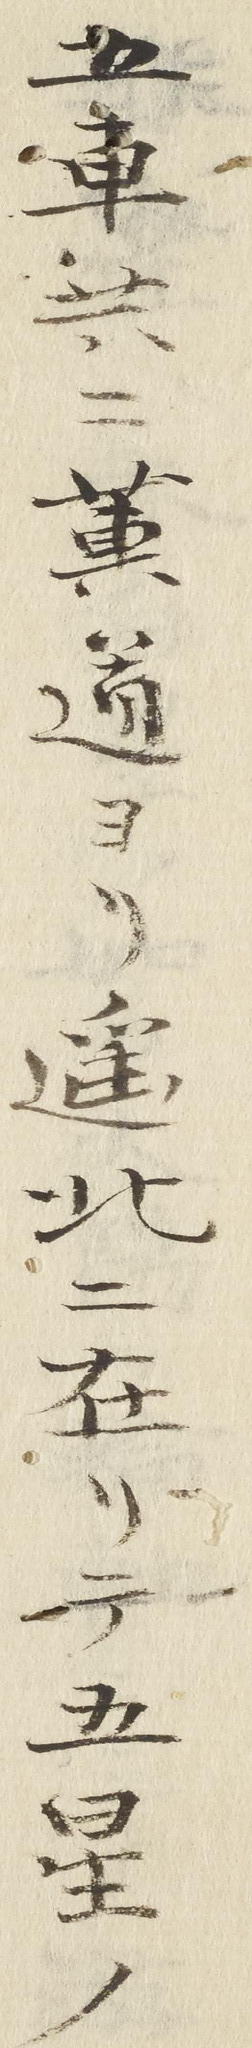五車共ニ黄道ヨリ遥北ニ在リテ五星ノ
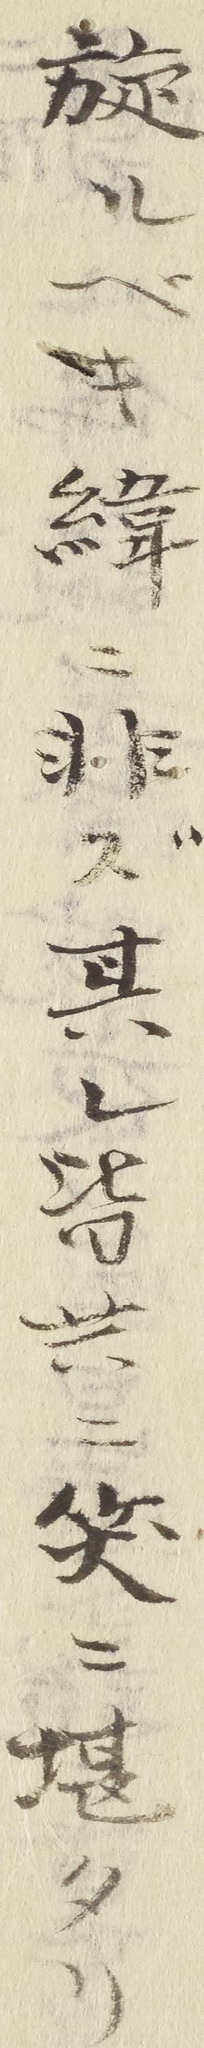旋ルベキ緯ニ非ズ其レ皆共ニ笑ニ堪タリ
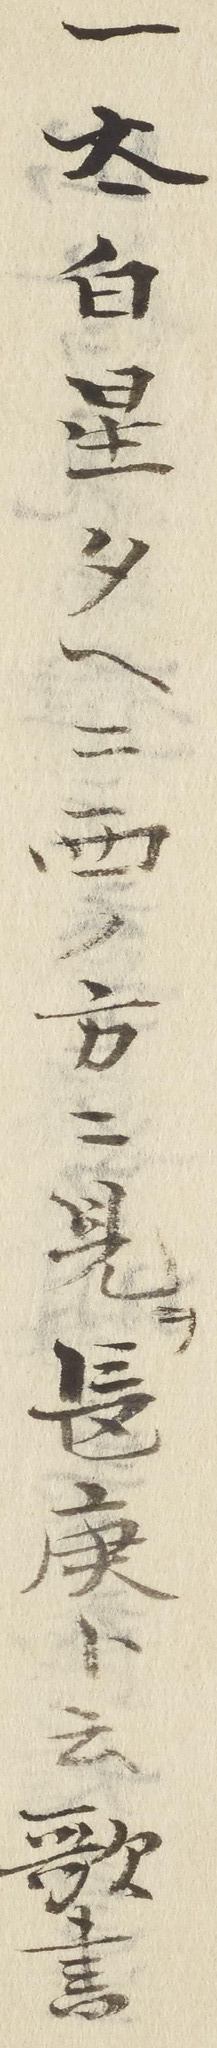一太白星夕ヘニ西ノ方ニ見ヲ長庚ト云歌書
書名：天象話説
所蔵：東京大学地震研究所図書室 Earthquake Research Institute Library, The University of Tokyo, JAPAN
